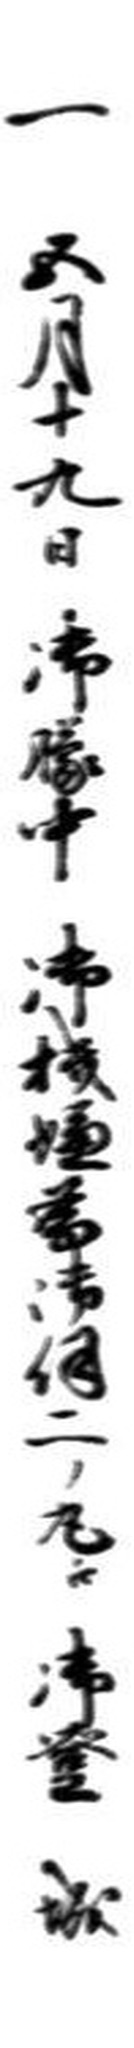一五月十九日御朦中御機嫌為御伺二ノ丸江御登城
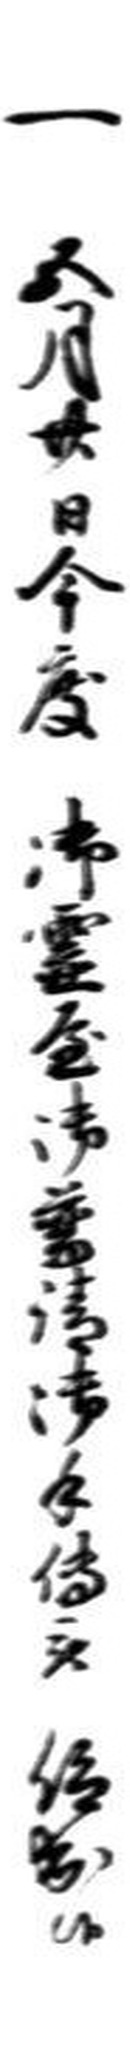一五月廿日今度御霊屋御普請御手伝被仰出候
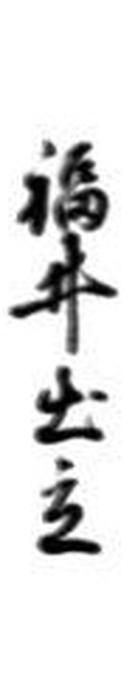福井出立

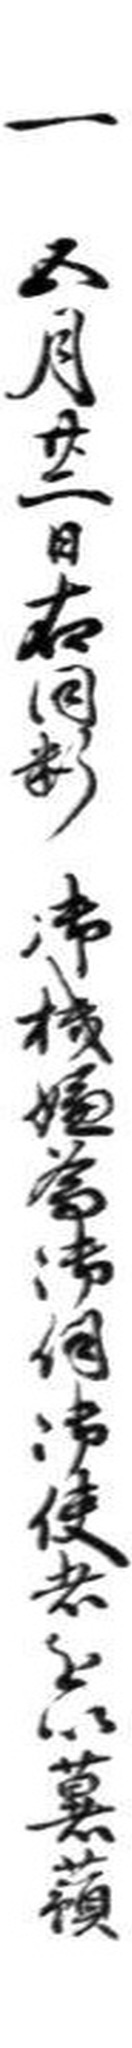一五月廿二日右同断御機嫌為御伺御使者を以薯蕷
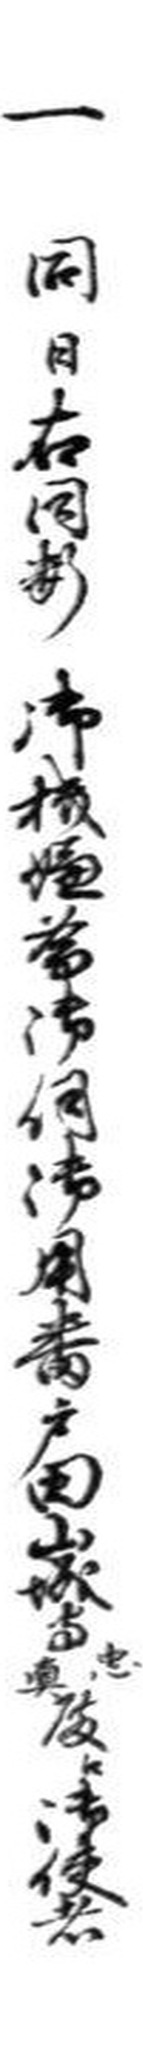一同日右同断御機嫌為御伺御用番戸田山城守忠真殿江御使者
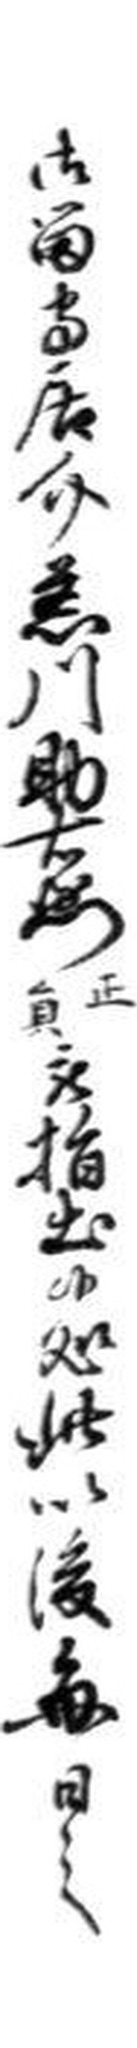御留守居介荒川助右衛門正員被指出候処此以後毎日之
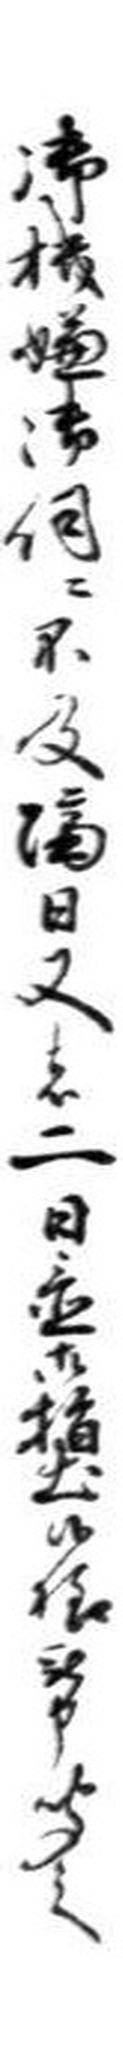御機嫌御伺ニ不及隔日又者二日置御指出候様被申聞之
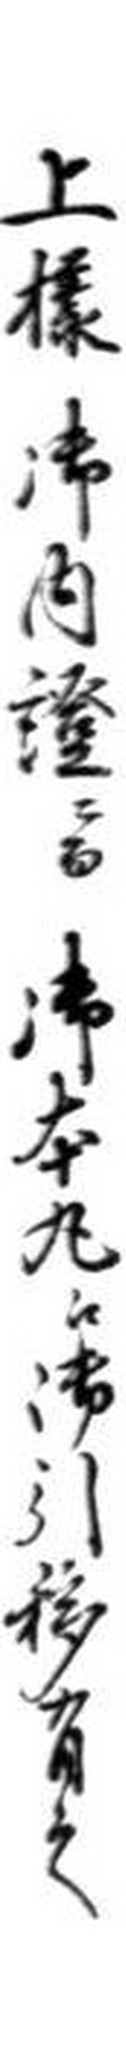上様御内証ニ而御本丸江御引移有之
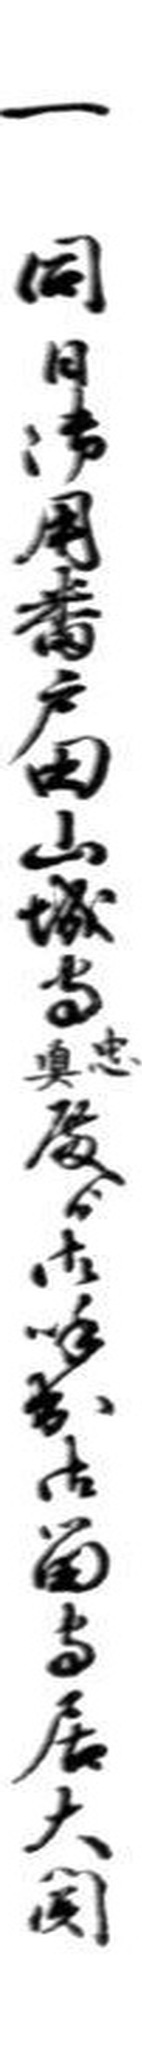一同日御用番戸田山城守忠真殿ゟ御呼出御留守居大関
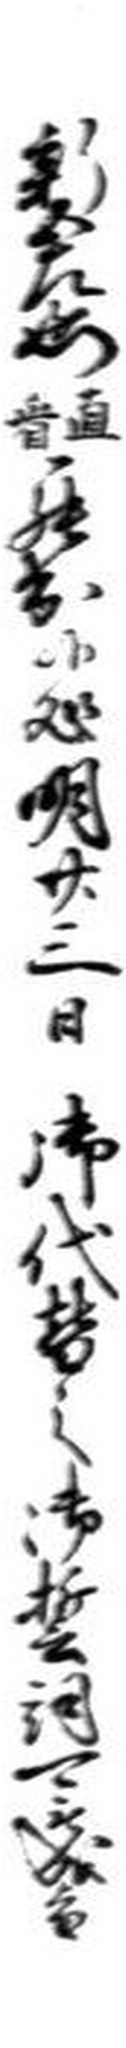新五左衛門直看罷出候処明廿三日御代替之御誓詞可被成旨
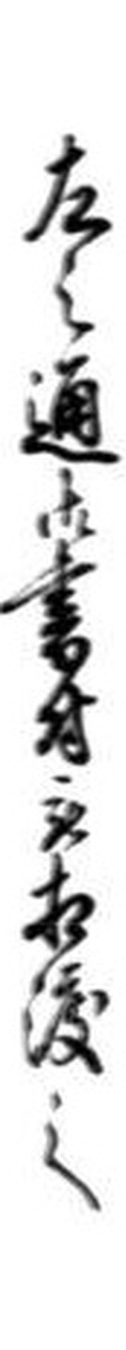左之通御書付被相渡之
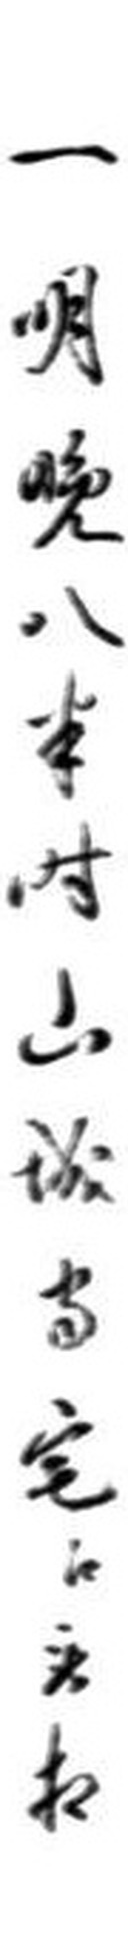一明晩八半時山城守宅江被相
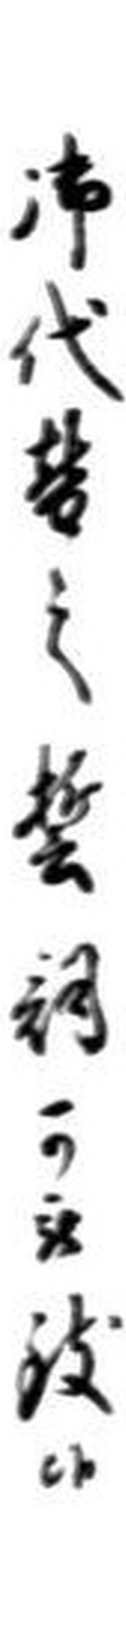御代替之誓詞可被致候
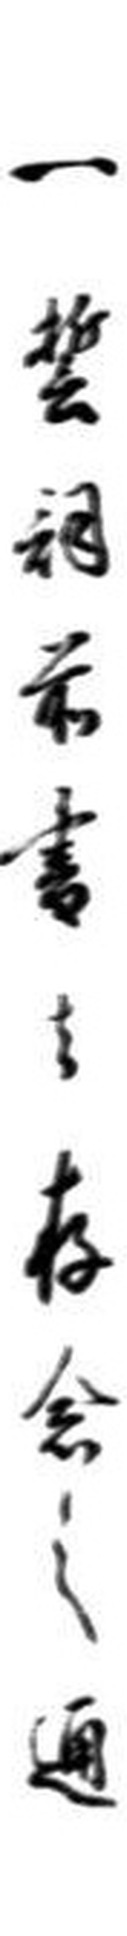一誓詞前書者存念之通
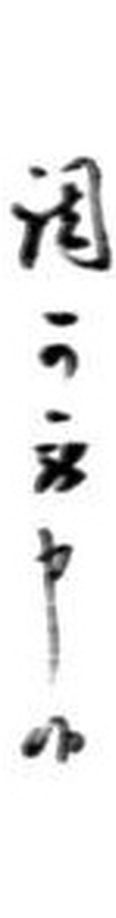調可被申候
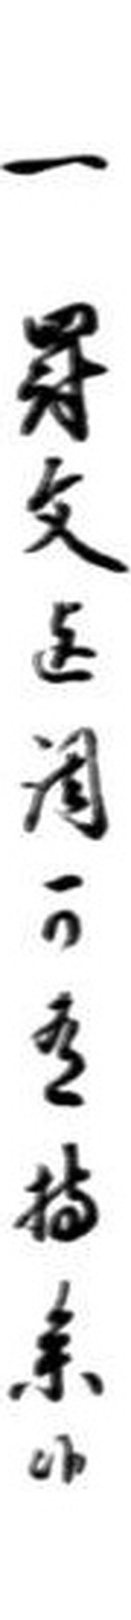一罰文迄調可有持参候
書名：家譜 三十一 吉邦公 享保元年
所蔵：福井県文書館 Fukui Prefectural Archives
